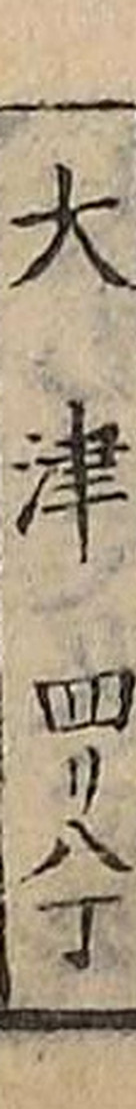大津四リ八丁
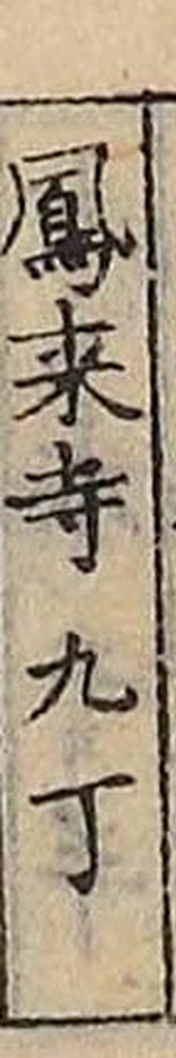鳳来寺九丁
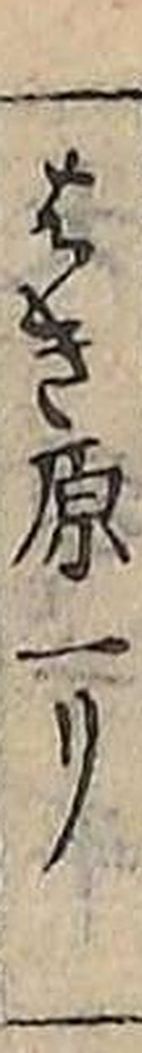はき原一リ
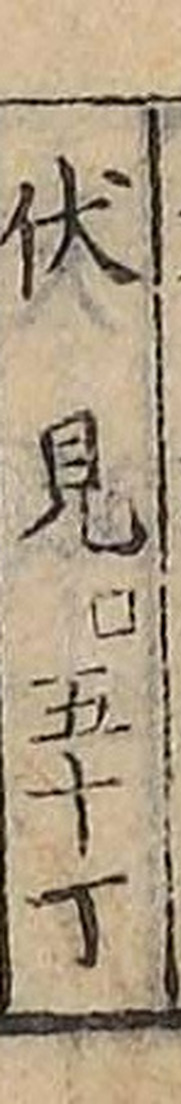伏見▫五十丁
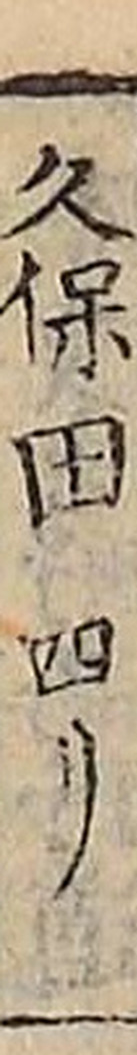久保田四リ
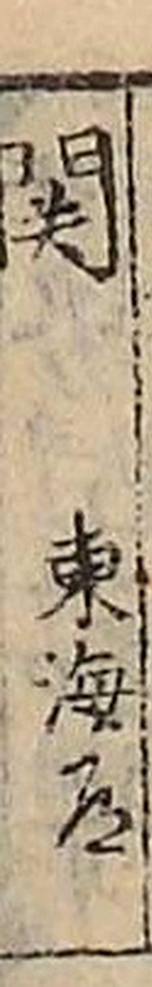関東海道
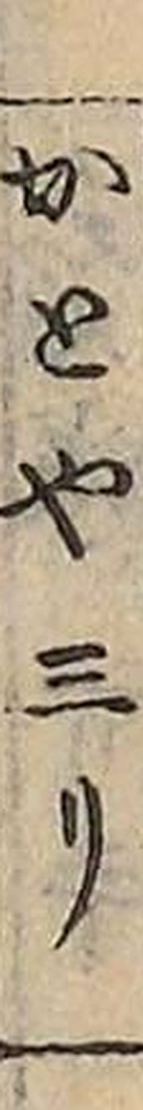かとや三リ
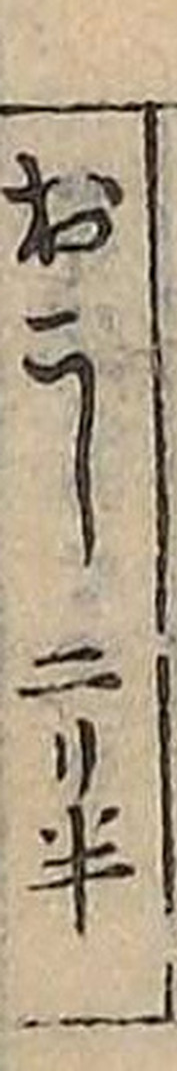おこし二リ半
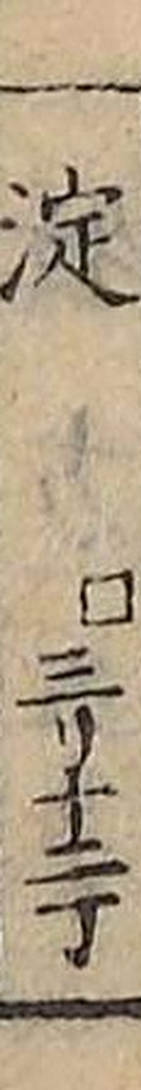淀▫三リ十二丁

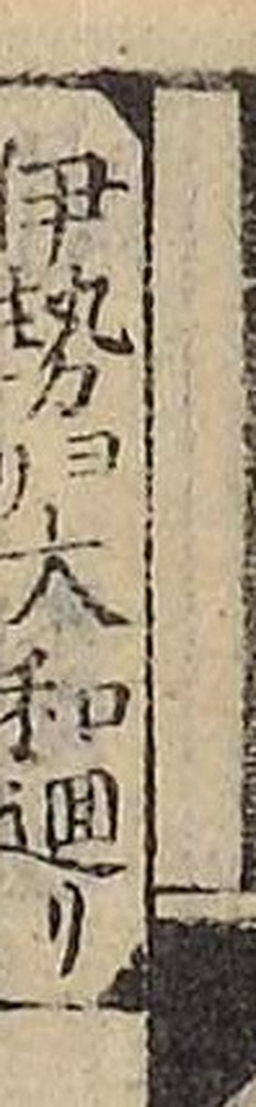伊勢ヨリ大和廻リ
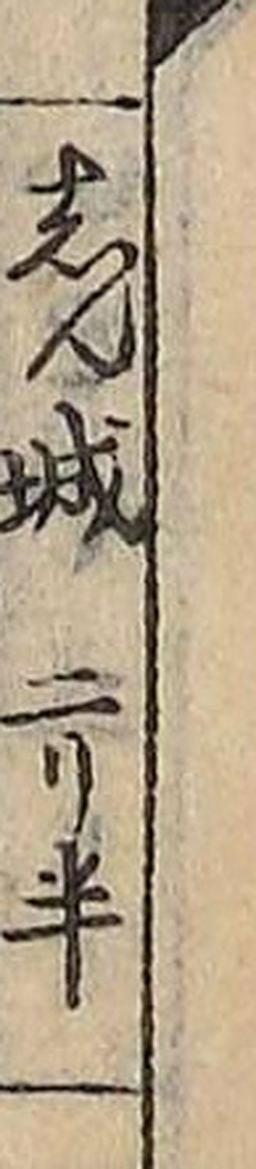しん城二リ半
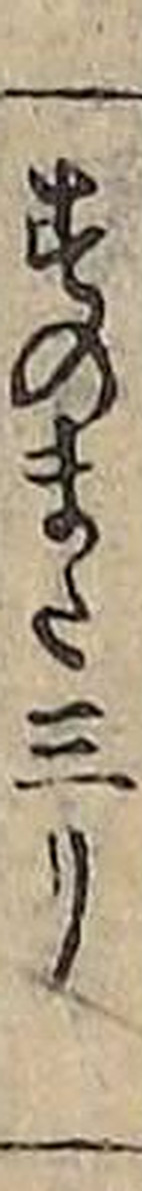すのまた三リ
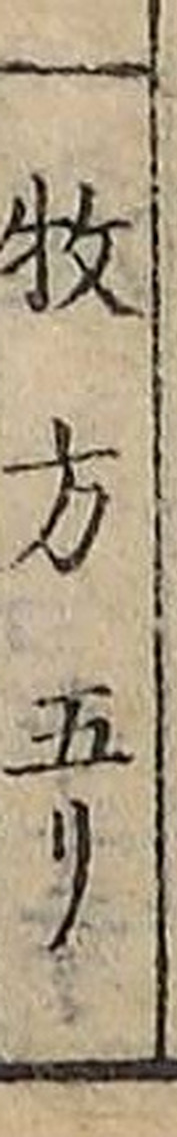枚方五リ
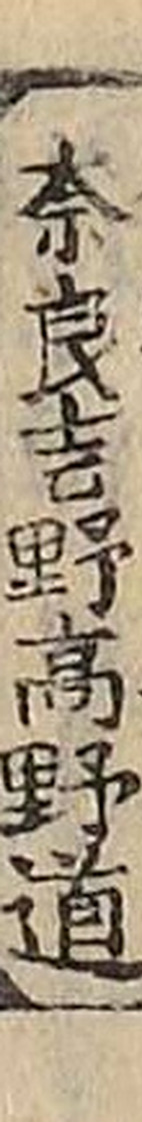奈良吉野高野道
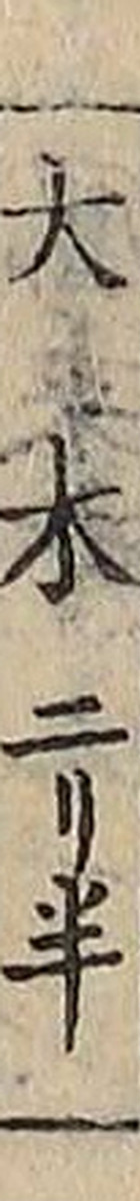大木二リ半
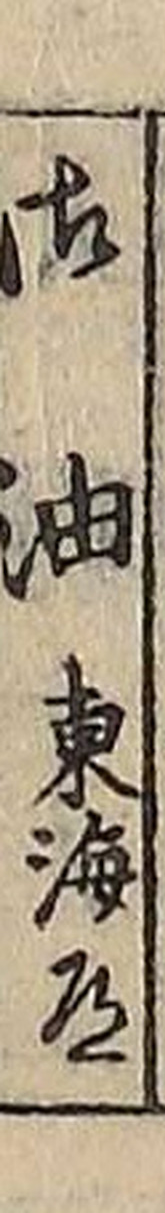御油東海道
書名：旅行用心集
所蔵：神戸大学附属図書館 国文学研究資料館
